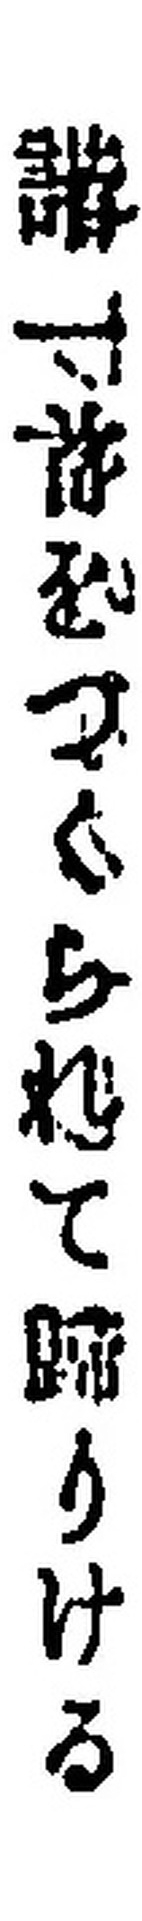諧一首をつくられて帰りける
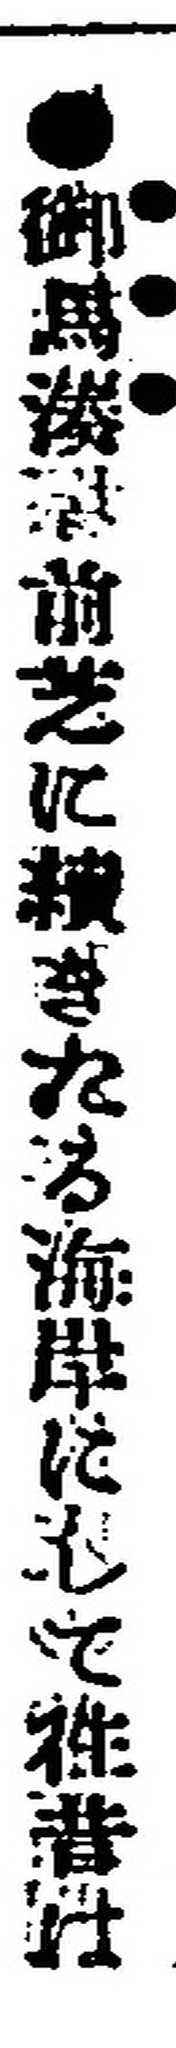●御馬湊前芝に続きたる海岸にして往昔は
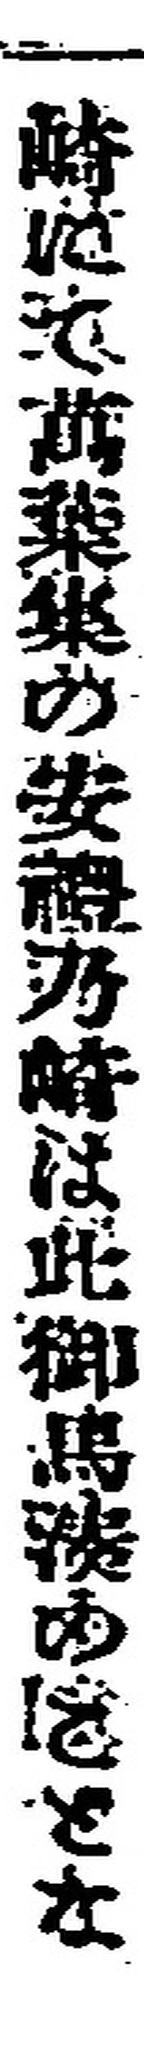崎にて万葉集の安礼乃崎は此御馬湊のことな
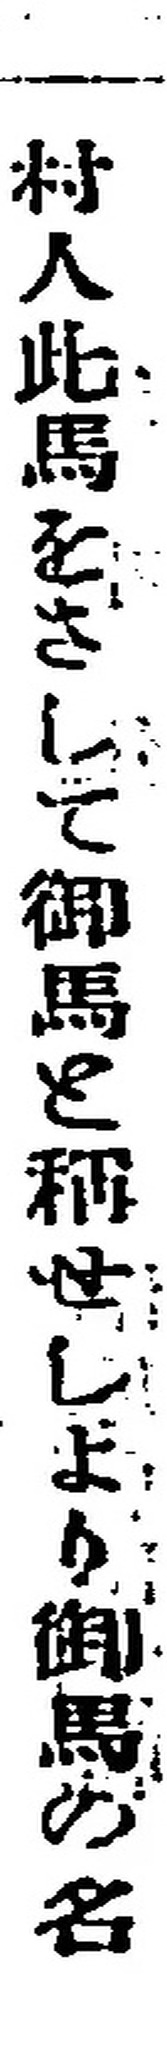村人此馬をさして御馬と称せしより御馬の名
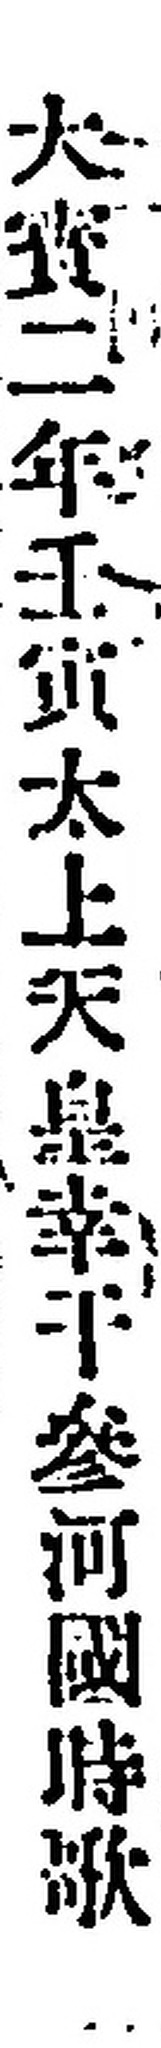大宝二年壬寅太上天皇幸于参河国時歌
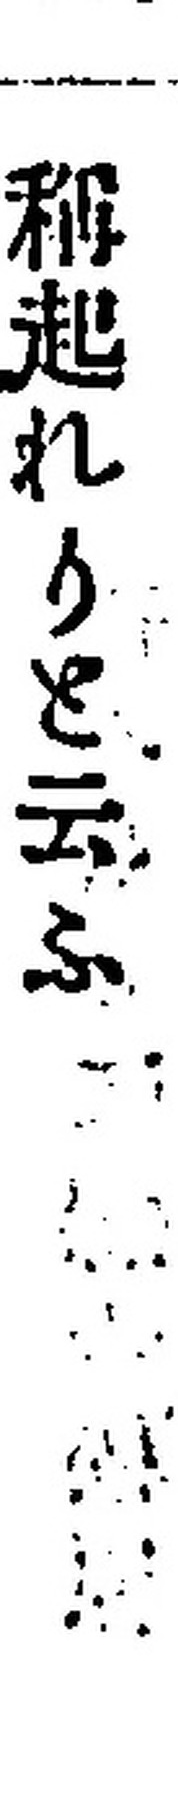称起れりと云ふ
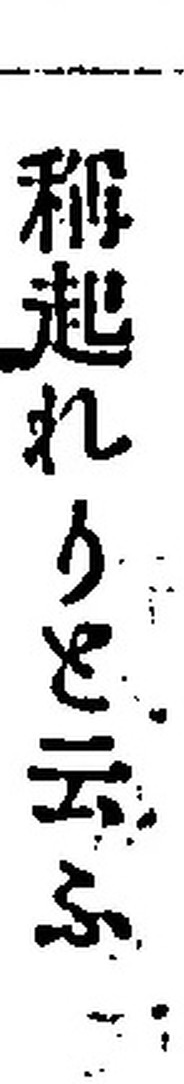称起れりと云ふ
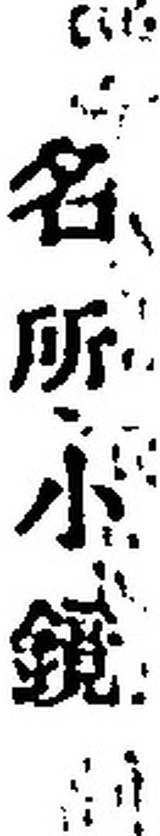名所小鏡
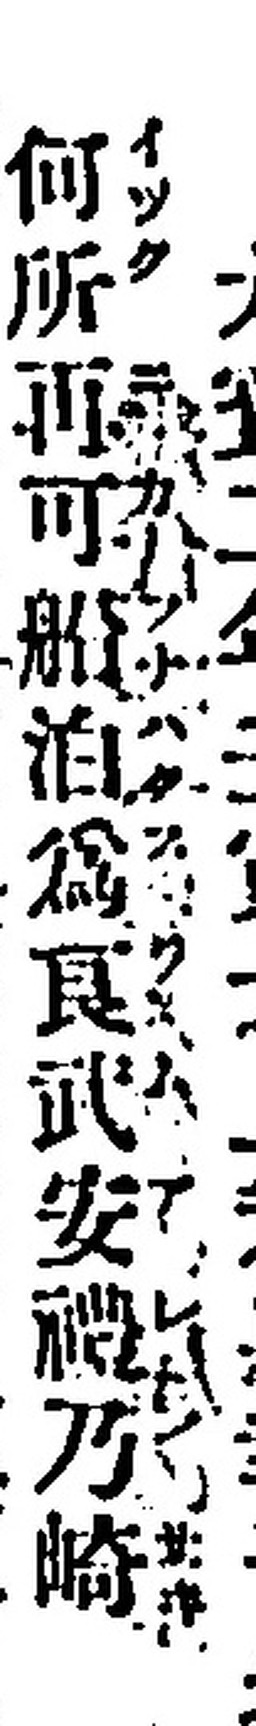何所再可船泊為良武安礼乃崎
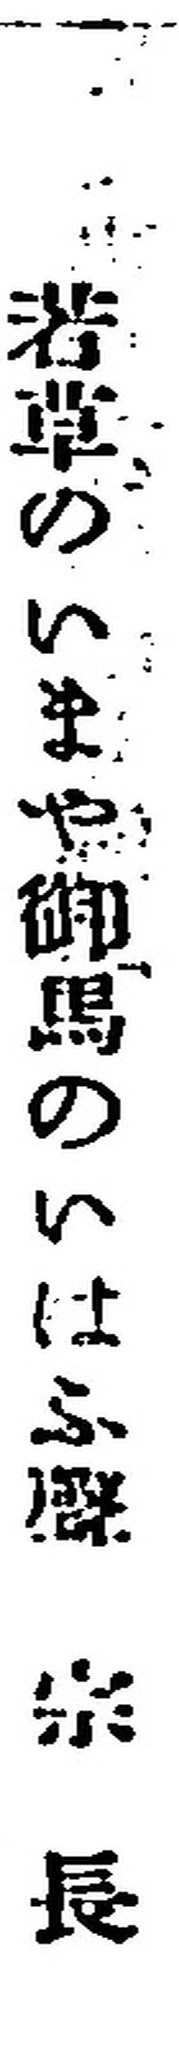若草のいまや御馬のいはふ声宗長
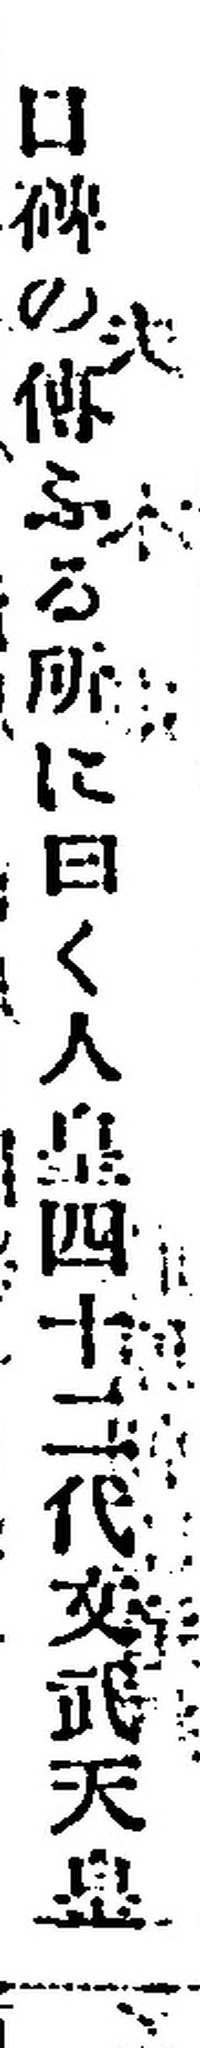口碑の伝ふる所に曰く人皇四十二代文武天皇
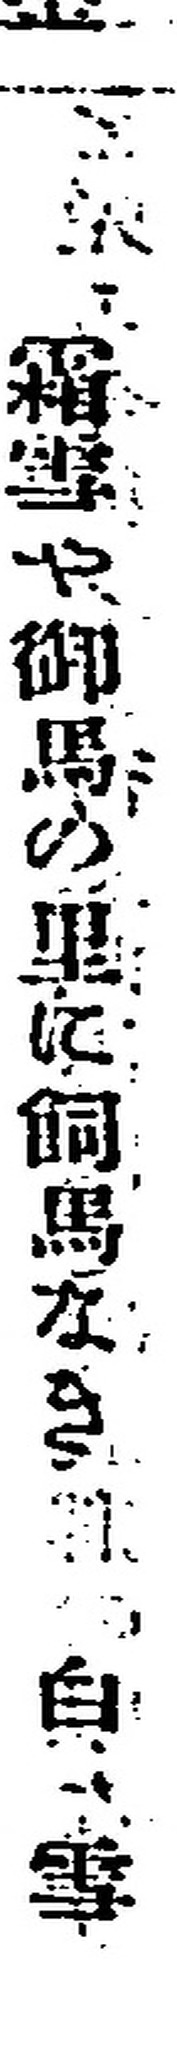霜雪や御馬の里に飼馬なき白雪
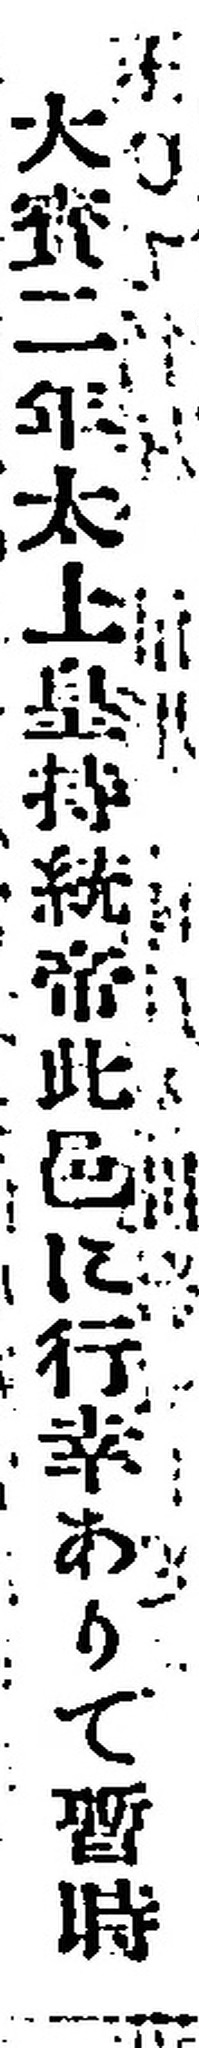大宝二年太上皇持統帝此邑に行幸ありて暫時
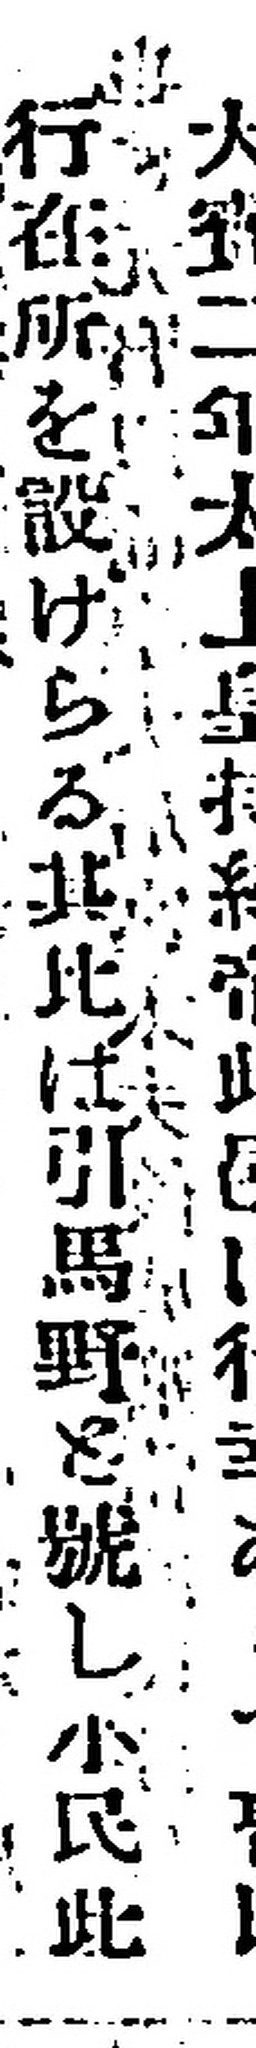行在所を設けらる其比は引馬野と号し小民此
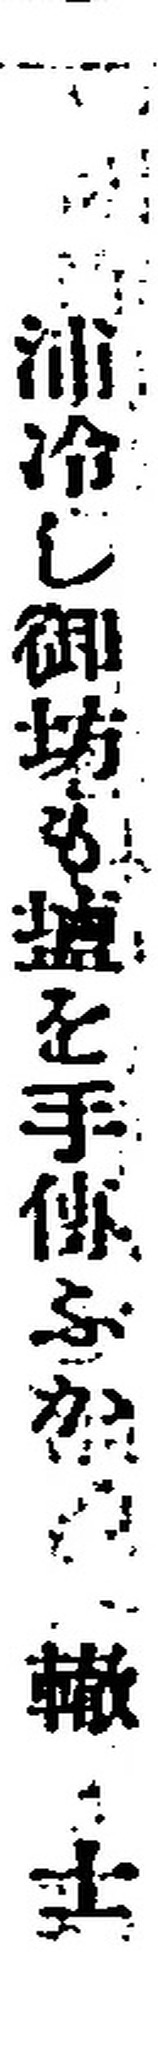浦冷し御坊も塩を手伝ふか轍士
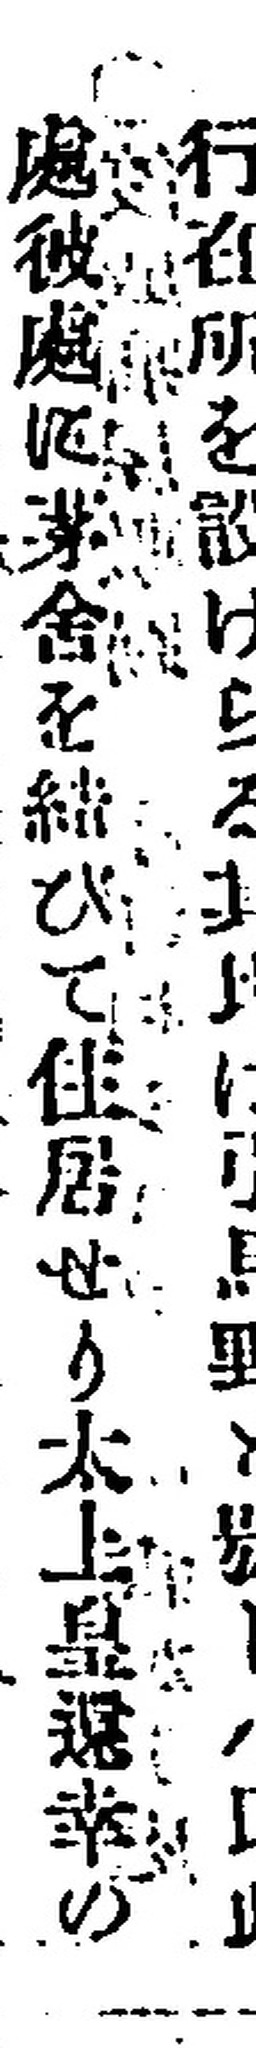処彼処に茅舎を結びて住居せり太上皇還幸の
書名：東参名勝案内
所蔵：国立国会図書館 National Diet Library, JAPAN
